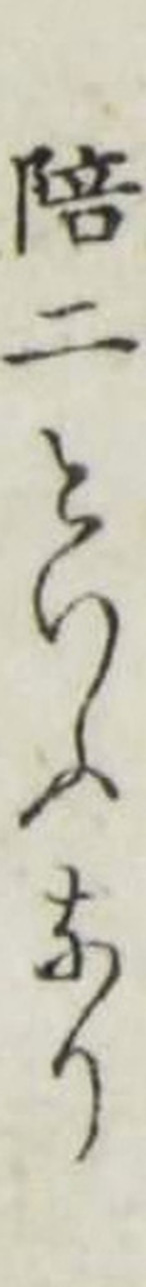陪二といふなり

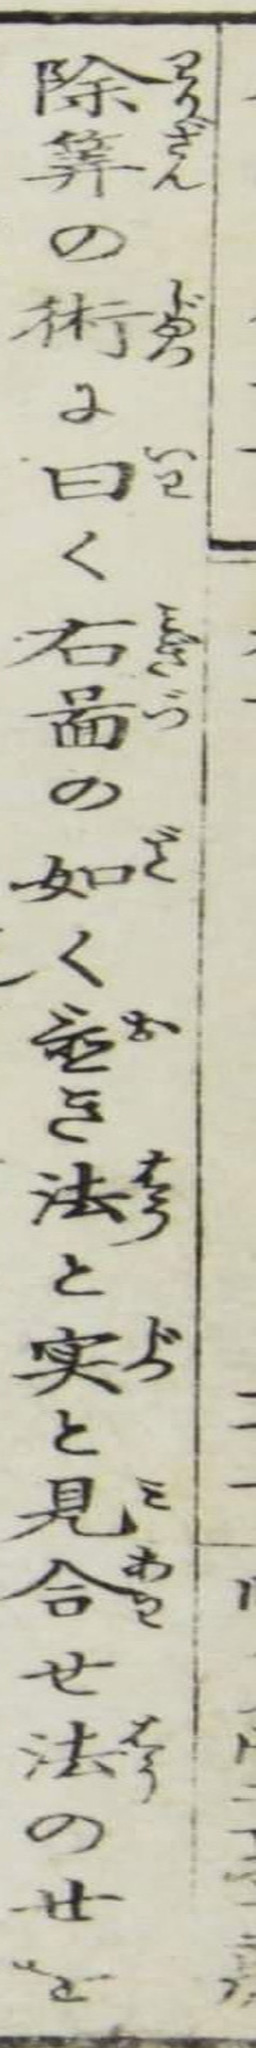除算の術に曰く右図の如く置き法と実と見合せ法の廿を
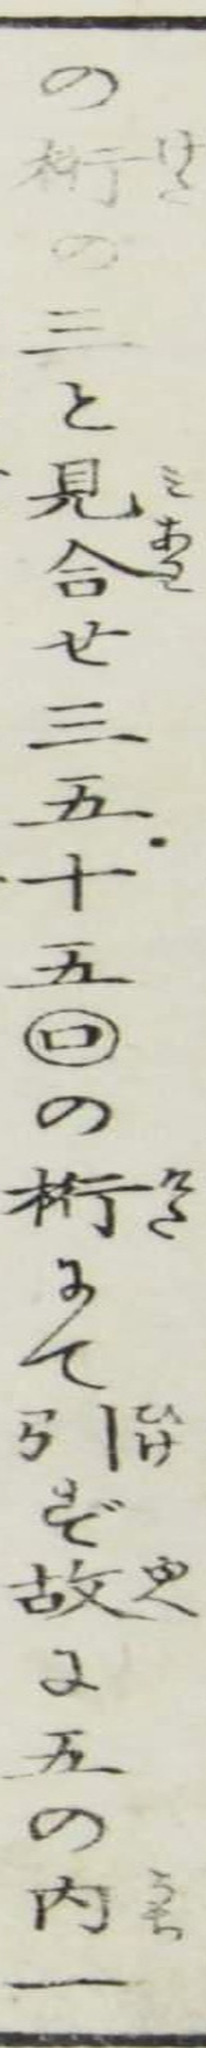の桁の三と見合せ三五．十五㋺の桁にて引ず故に五の内一
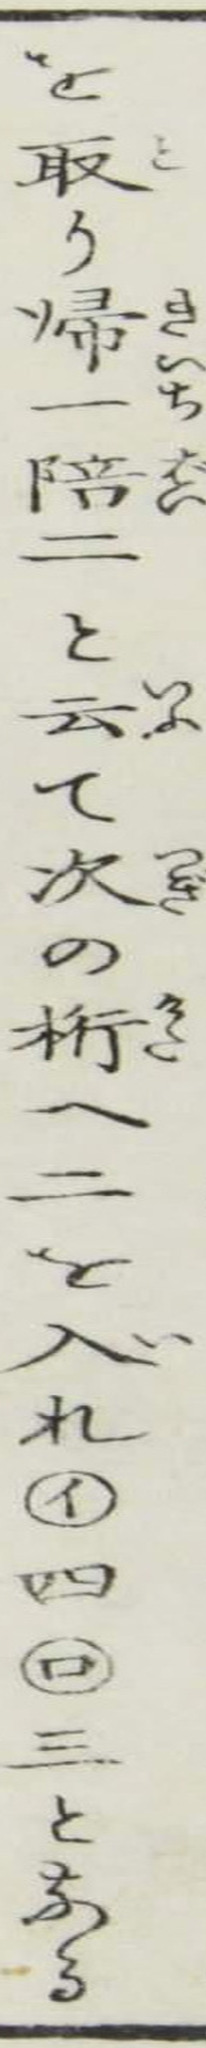を取り帰一陪二と云て次の桁へ二を入れ㋑四㋺三となる
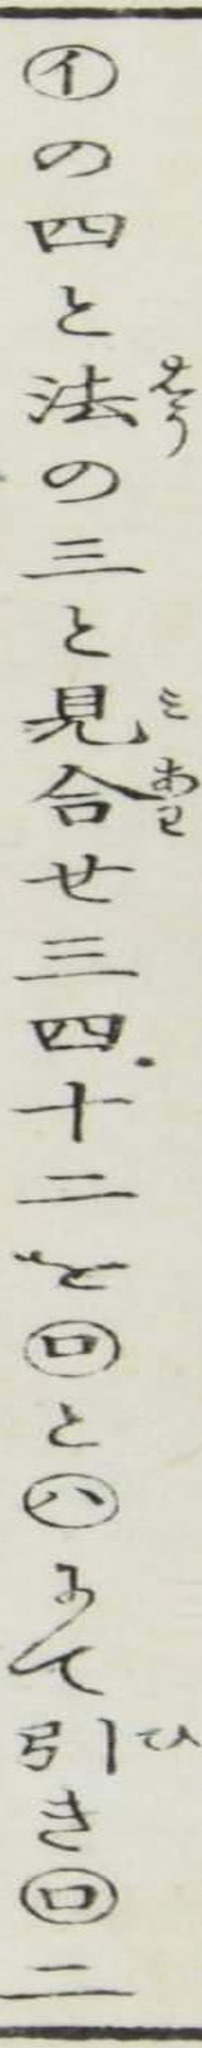㋑の四と法の三と見合せ三四．十二を㋺と㋩にて引き㋺二
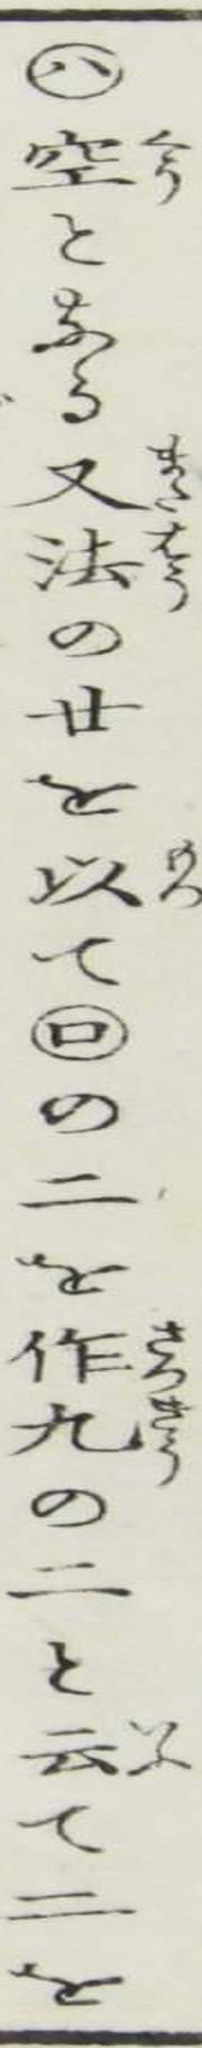㋩空となる又法の廿を以て㋺の二を作九の二と云て二を
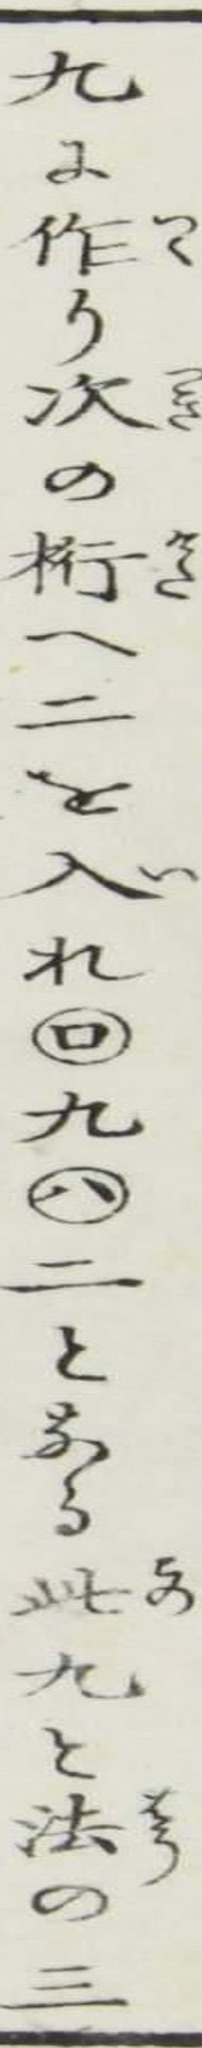九に作り次の桁へ二を入れ㋺九㋩二となる此九と法の三
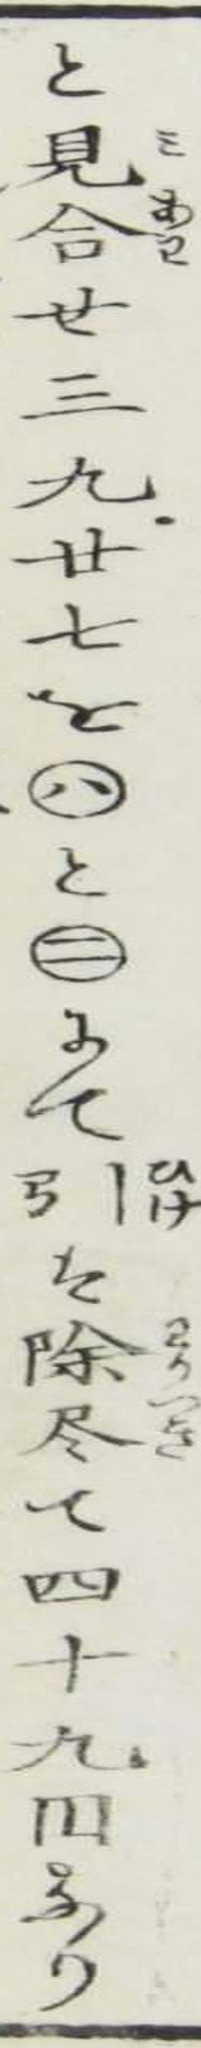と見合せ三九．廿七を㋩と㋥にて引は除尽て四十九円なり
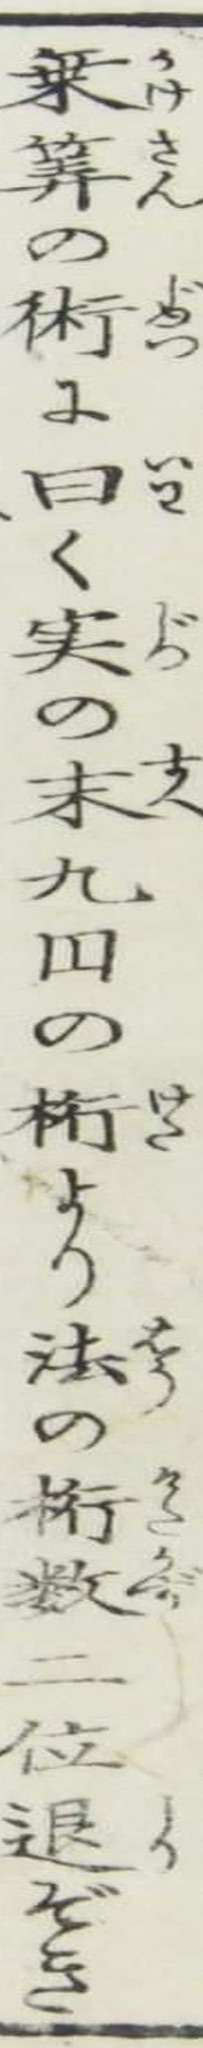乗算の術に曰く実の末九円の桁より法の桁数二位退ぞき
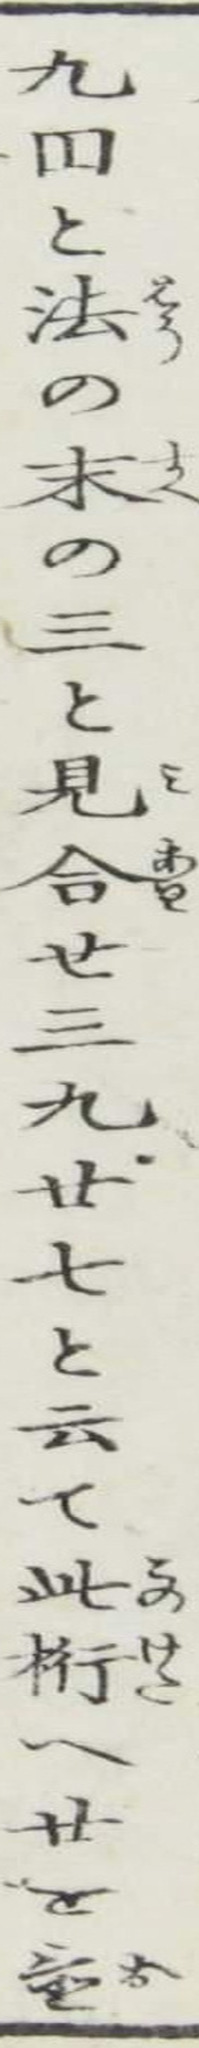九円と法の末の三と見合せ三九．廿七と云て此桁へ廿を置
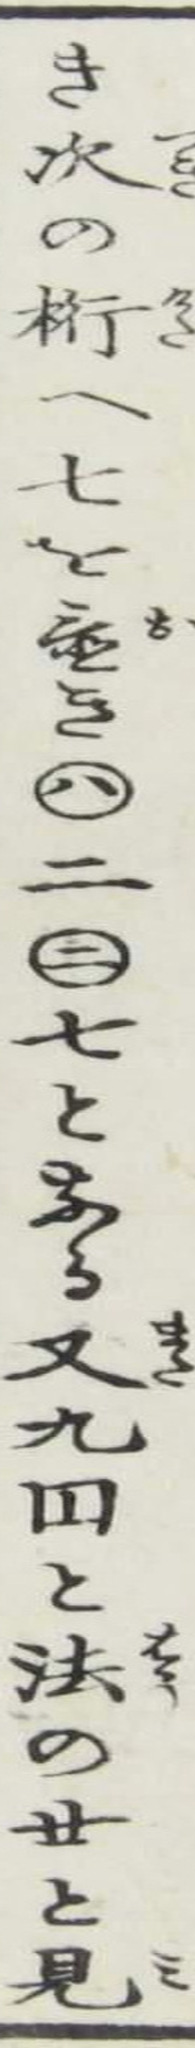き次の桁へ七を置き㋩二㋥七となる又九円と法の廿と見
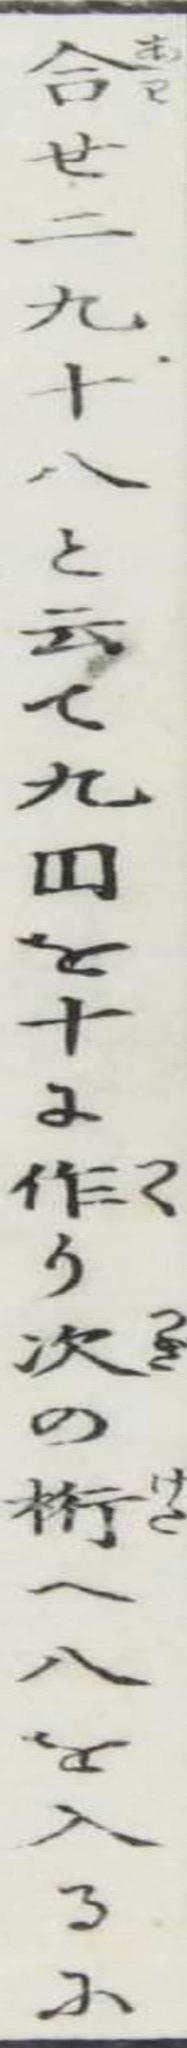合せ二九．十八と云て九円を十に作り次の桁へ八を入るに
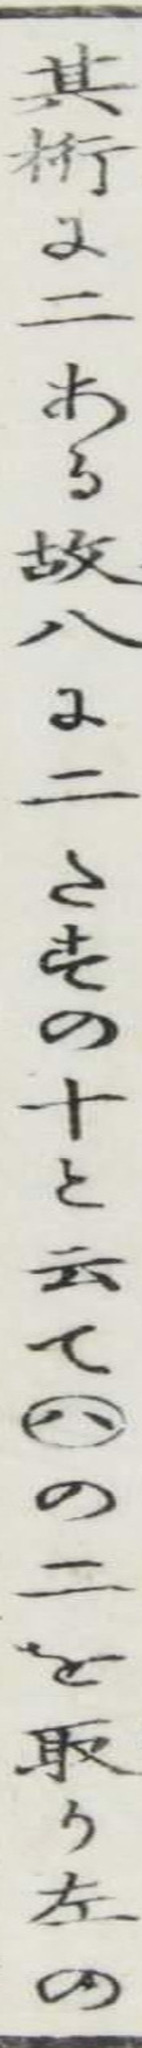其桁に二ある故八に二たすの十と云て㋩の二を取り左の
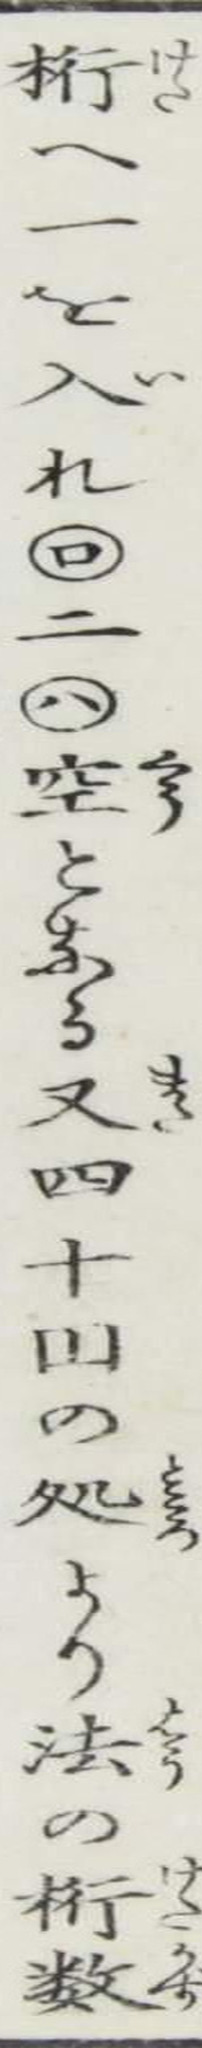桁へ一を入れ㋺二㋩空となる又四十円の処より法の桁数
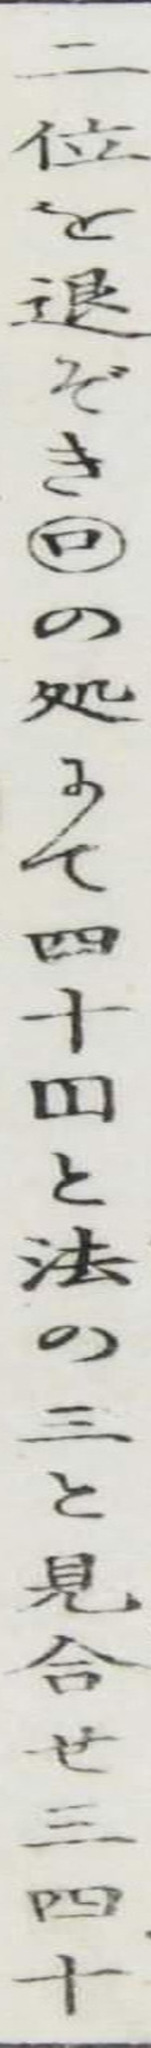二位を退ぞき㋺の処にて四十円と法の三と見合せ三四．十
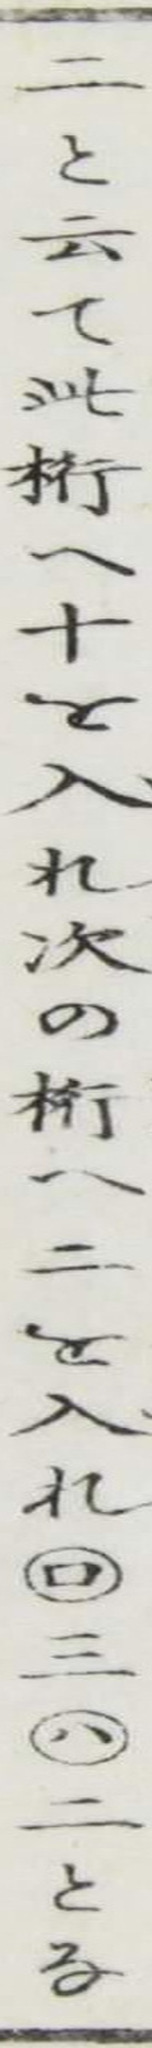二と云て此桁へ十を入れ次の桁へ二を入れ㋺三㋩二とな
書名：明治小學塵劫記 卷1
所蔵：東京学芸大学教育コンテンツアーカイブ
